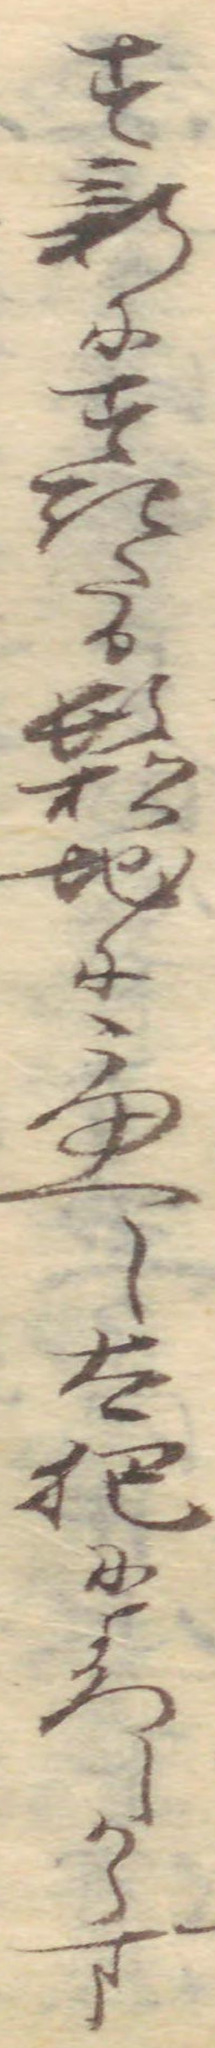す新にすきたる鬆地にうゆへし太肥によろしからす
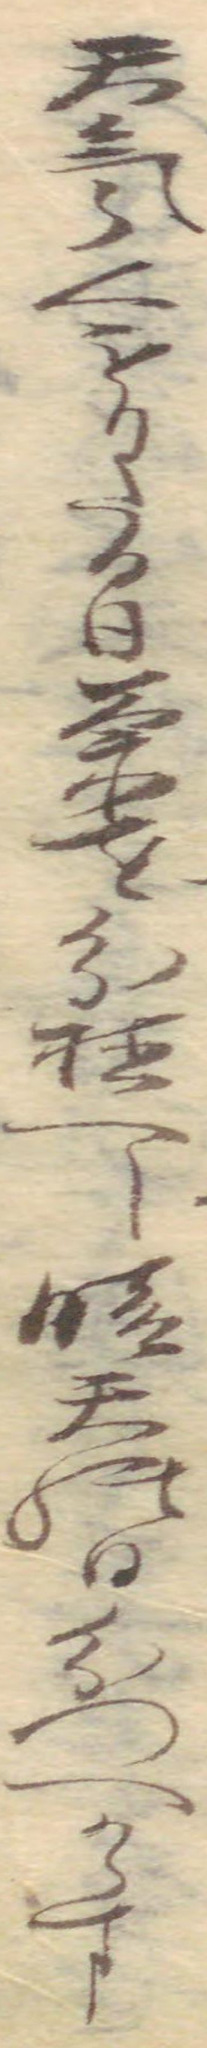天気くもりたる日菊を分植へし晴天の日分つへからす
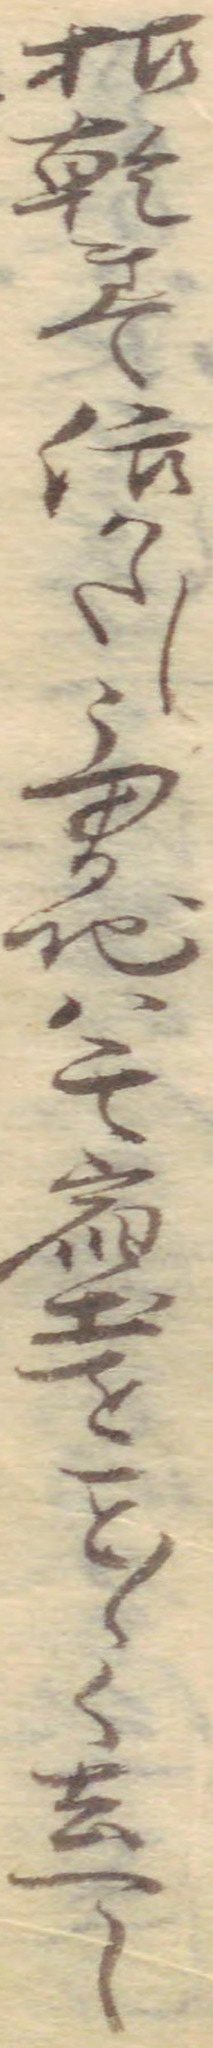根乾きて活かたしうゆる地ハ其宿土をこと〳〵く去るへし
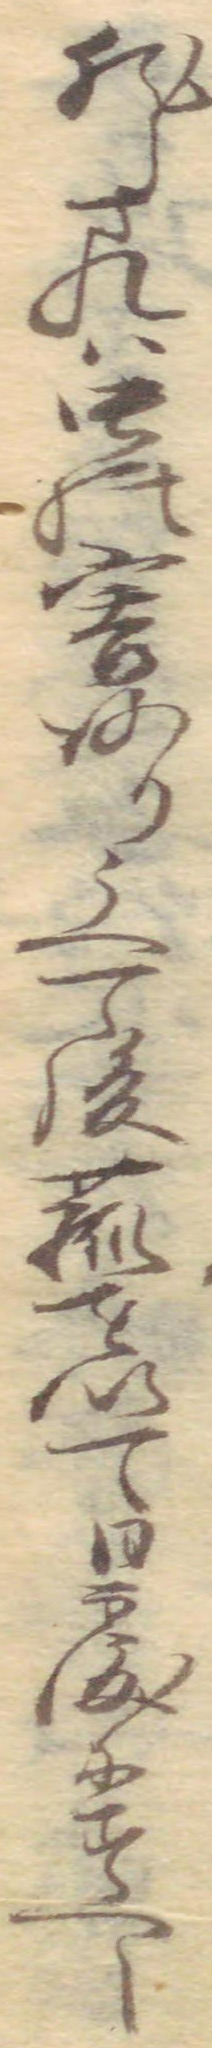然らされハ虫の害ありうへて後菰を以て日覆にすへし

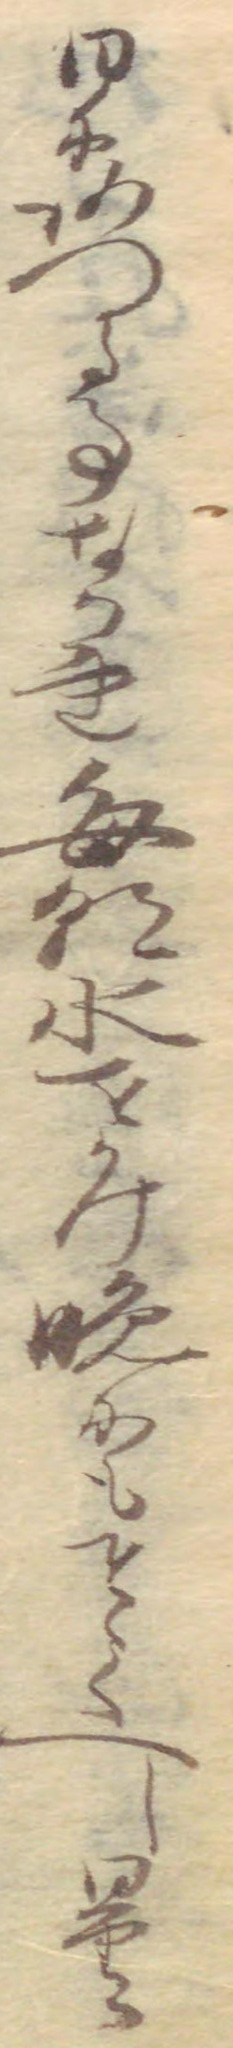日にあつる事なかれ毎朝水をかけ晩にもそゝくへし曇
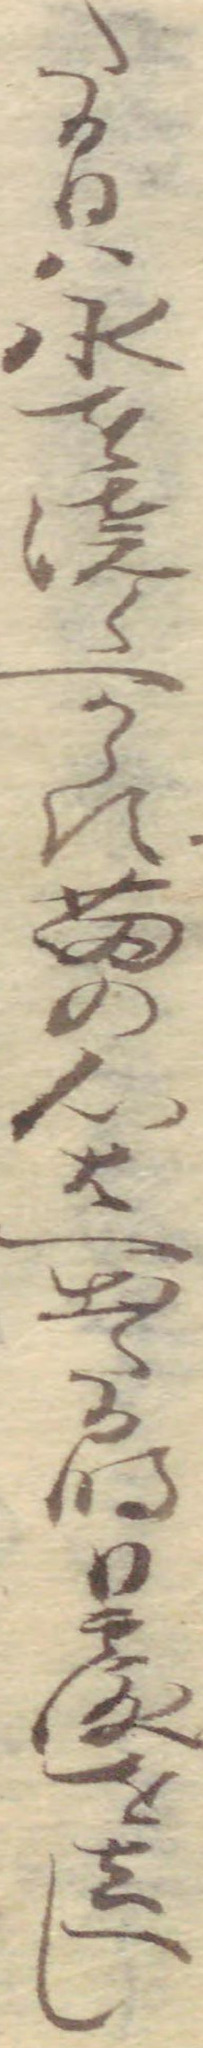たる日ハ水を澆くへからす苗の心はへ出たる時日覆を去へし
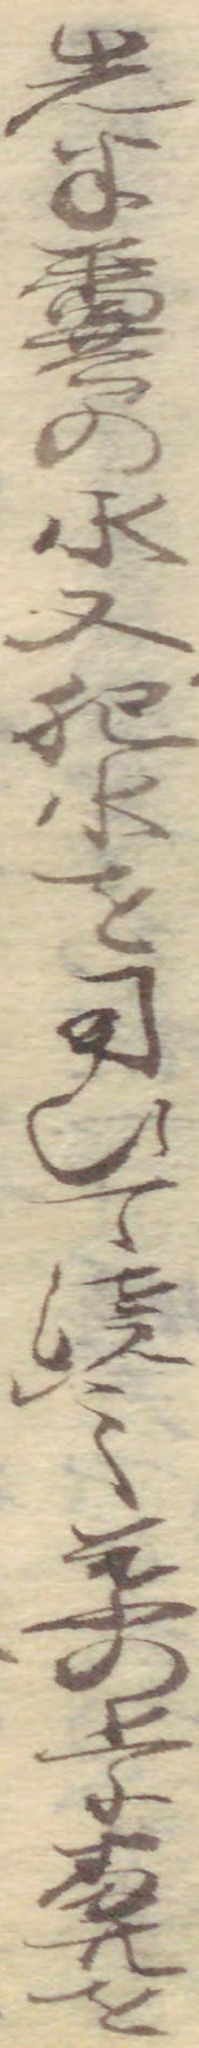先半糞の水又肥水を用ひて澆之葉の上に糞を
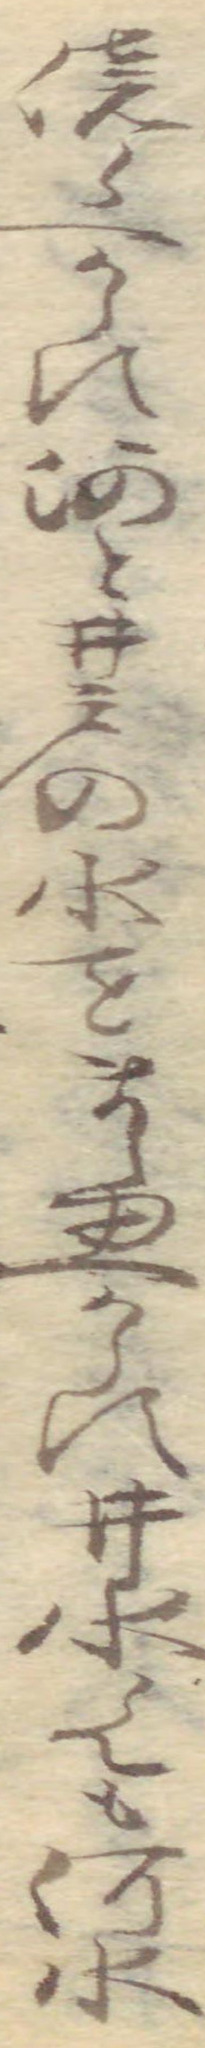澆らへからすあと井戸の水をましゆへからす井水ニても河水
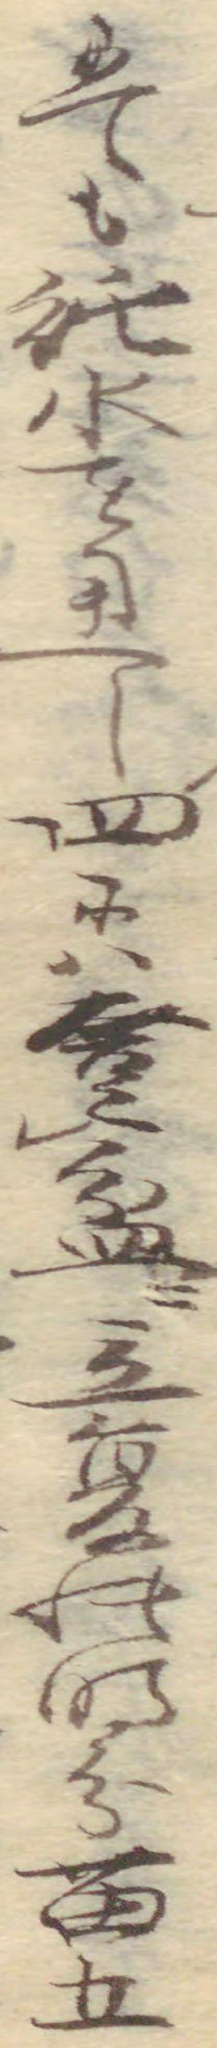にても純水を用へし四にハ登盆立夏の時分苗五
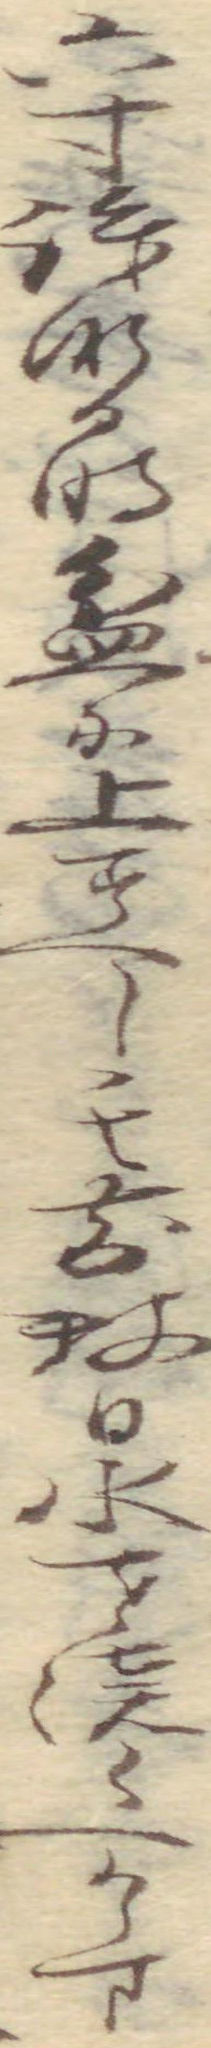六寸許なる時盆に上すへし其前数日水を澆くへからす
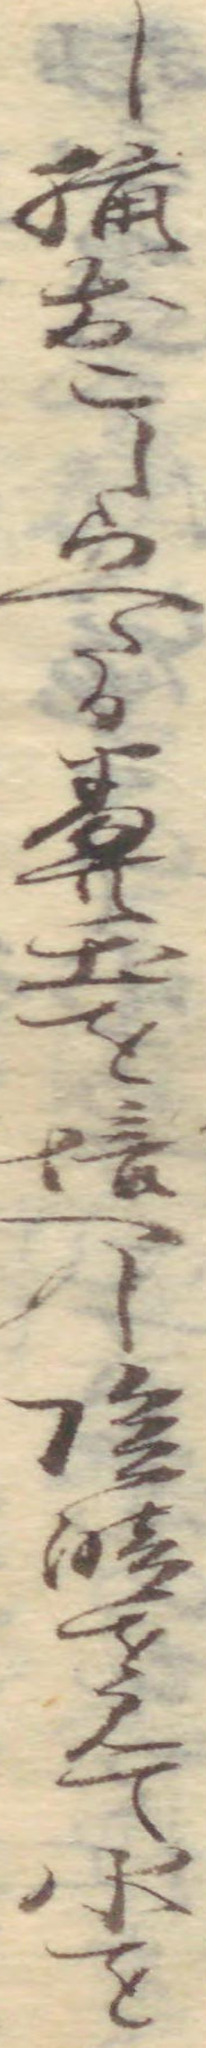し猟前こしらへたる糞土を培へし陰晴を見て水を
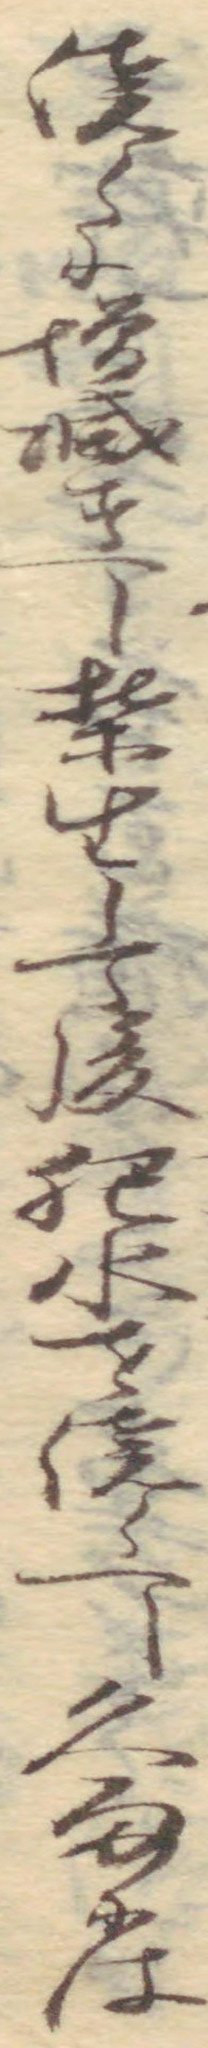澆くに増減すへし葉生して後肥水を澆くへし久雨には
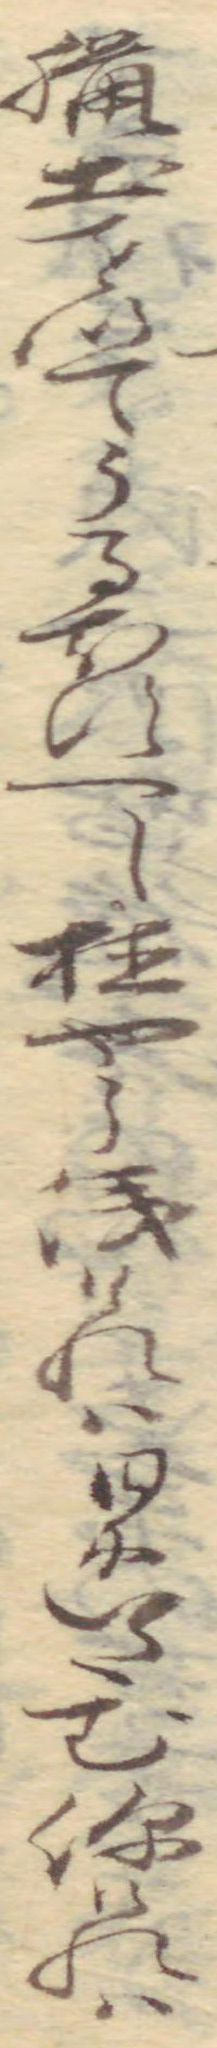猟土を以てうるおすへし植やう浅けれハ日にいたむ深けれハ
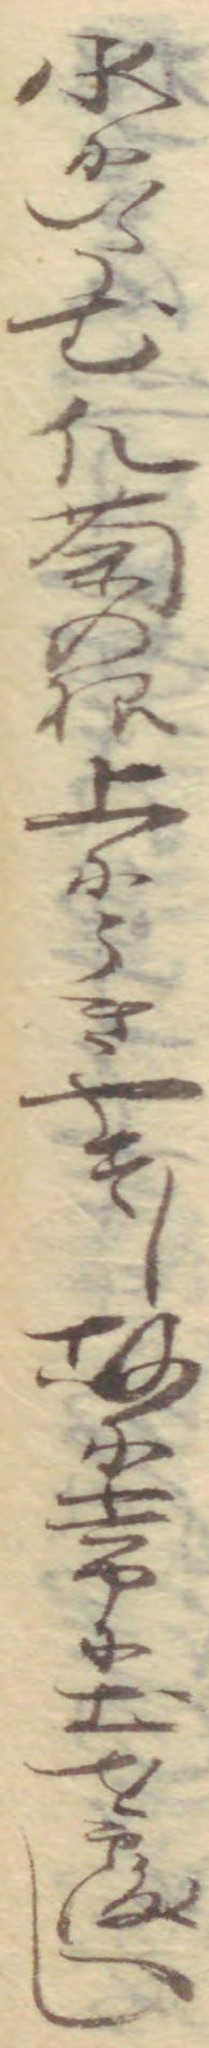水にいたむ凡そ菊の根上にうきやすし故に常に土を覆へし
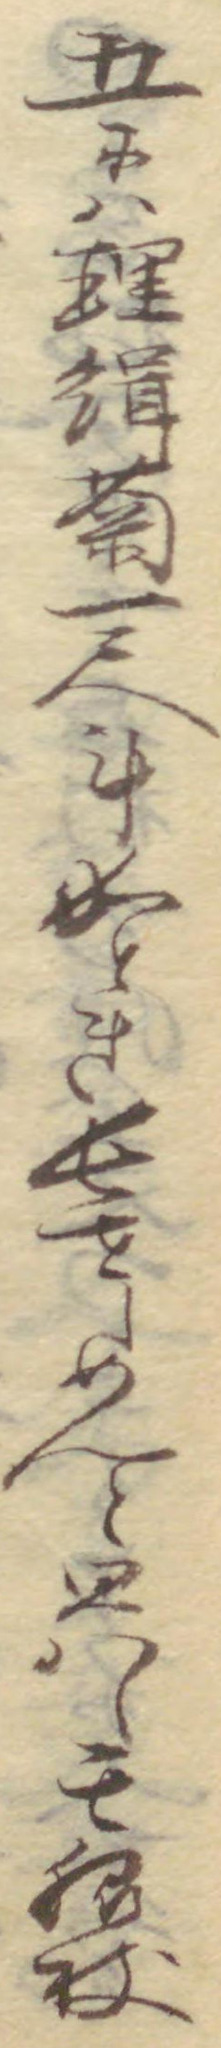五にハ理緝菊一尺斗成とき長をしめんと思ハヽ脇枝
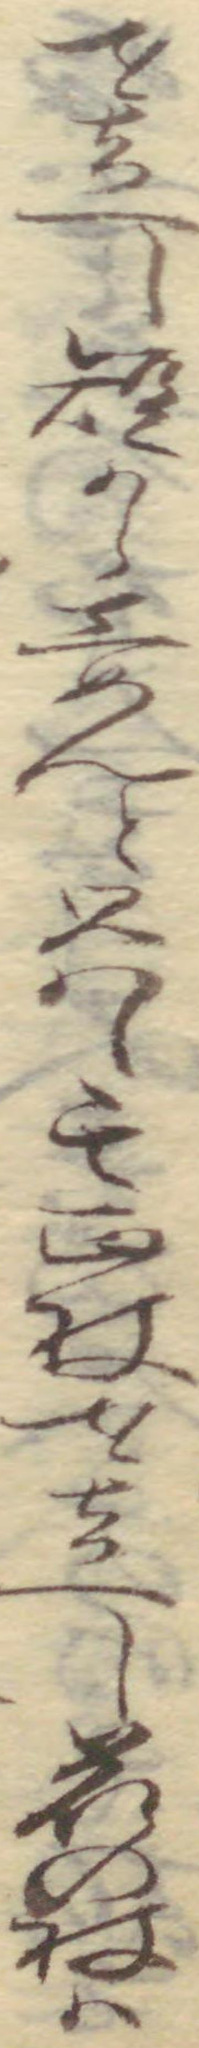を去へし短からしめんと思ハヽ其正枝を去へし花の枝ハ
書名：鶯宿雑記. 巻199-200
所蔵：国立国会図書館 National Diet Library, JAPAN
